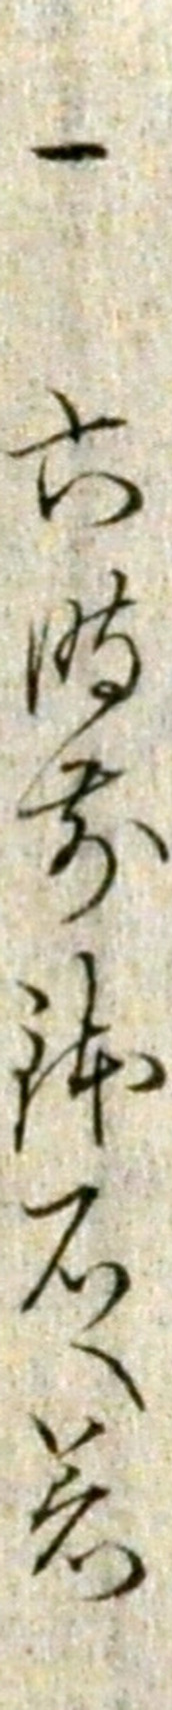一六時前鉢石へ着
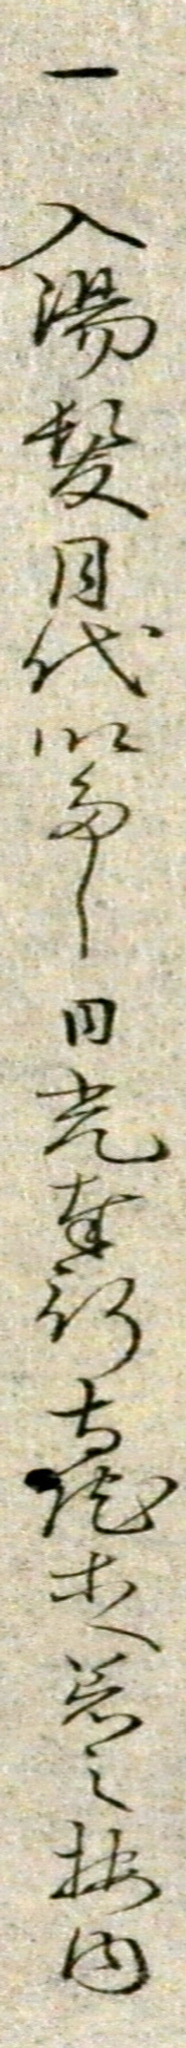一入湯髪月代いたし日光奉行寺院等へ着之按内
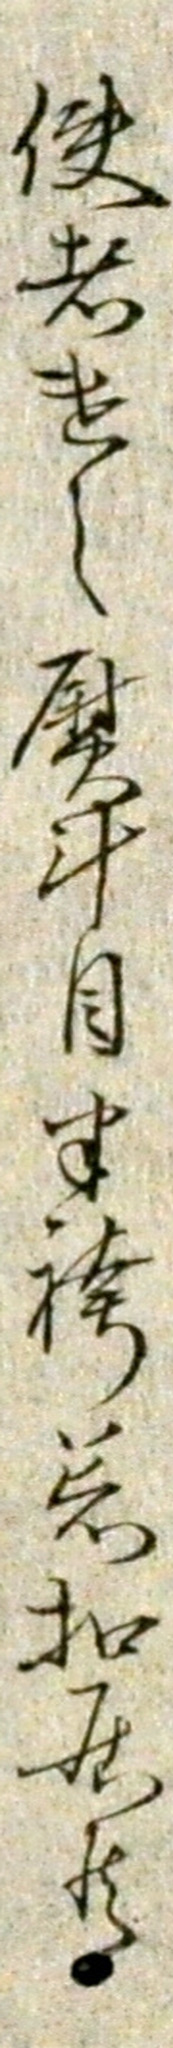使者遣之熨斗目半袴着扣居候
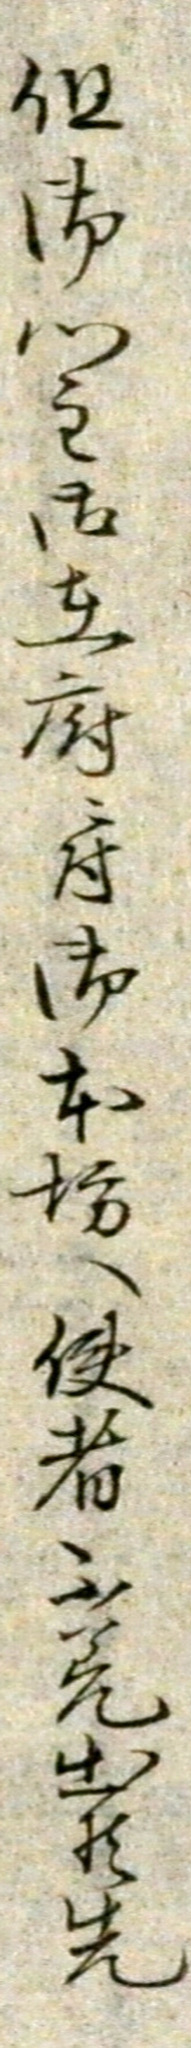但御門主御在府ニ付御本坊へ使者不差出候先
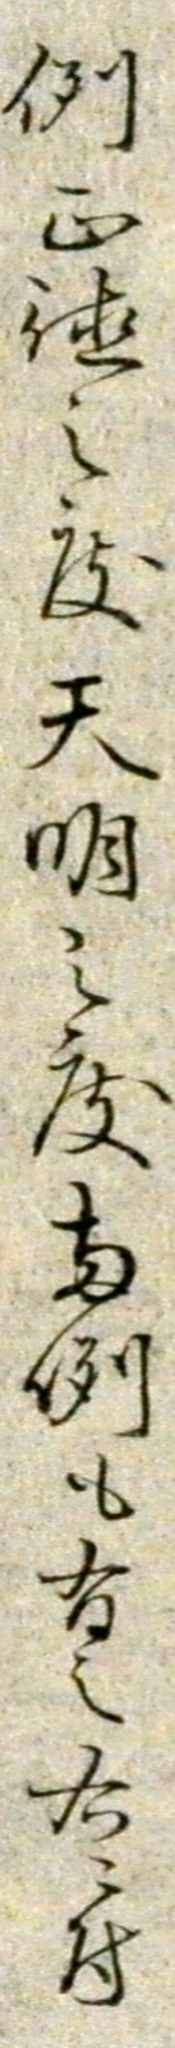例正徳之度天明之度両例も有之右ニ付
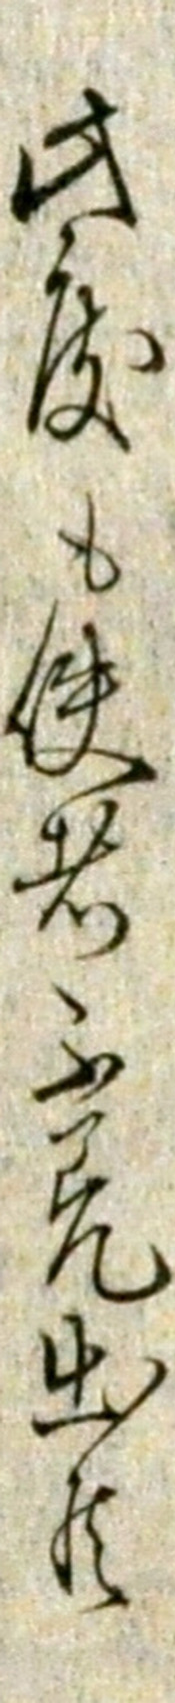此度も使者不差出候
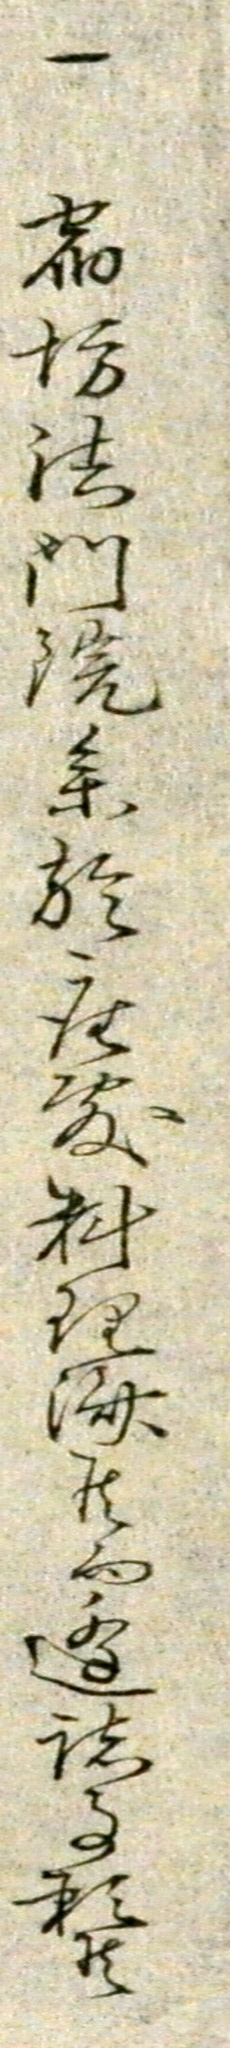一宿坊法門院参於座敷料理済候而逢諸事頼候
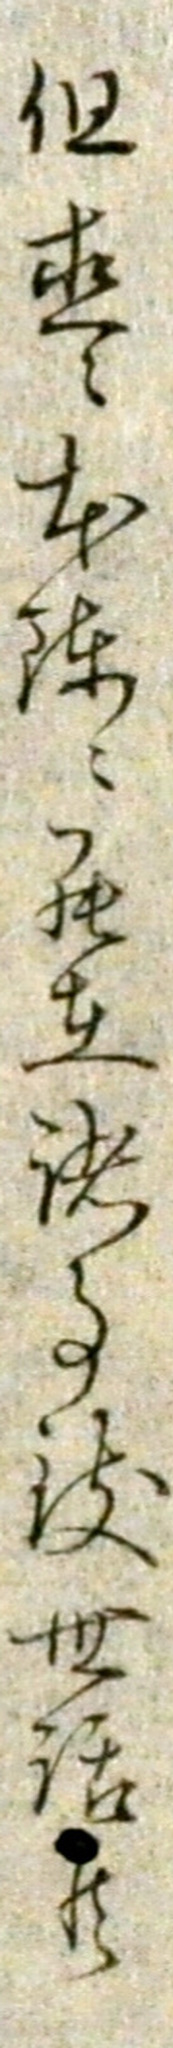但直ニ本陣ニ罷在諸事致世話候
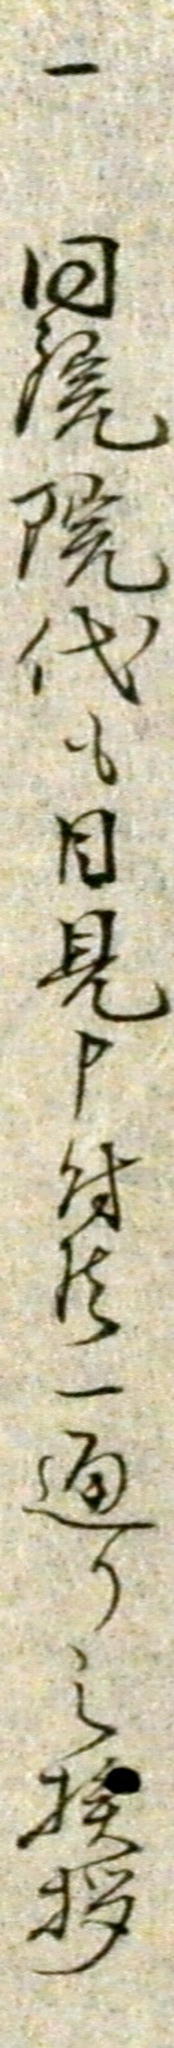一同院院代も目見申付共一通り之挨拶
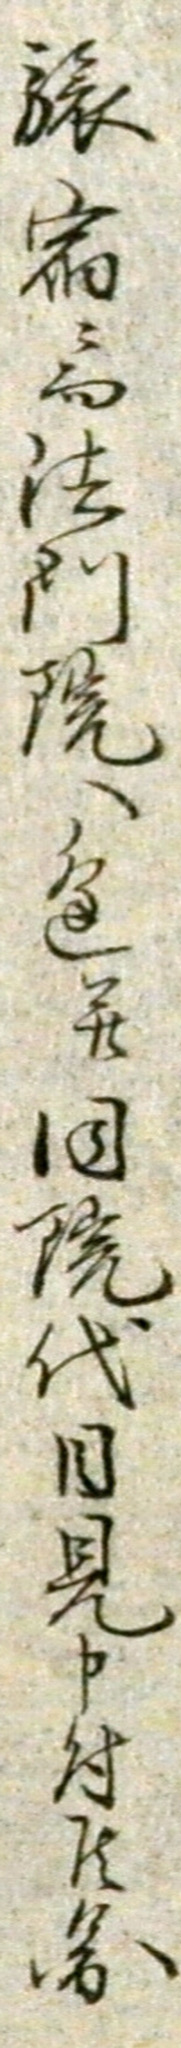旅宿ニ而法門院へ逢幷同院代目見申付候図

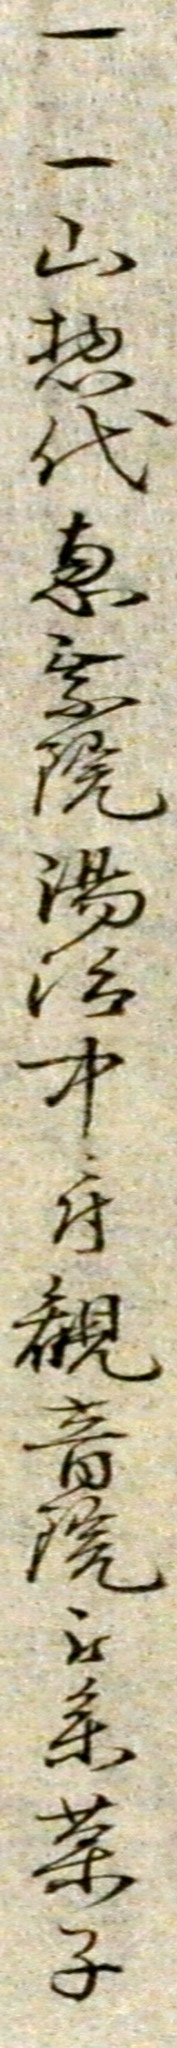一一山惣代恵乘院湯治中ニ付観音院江参菓子
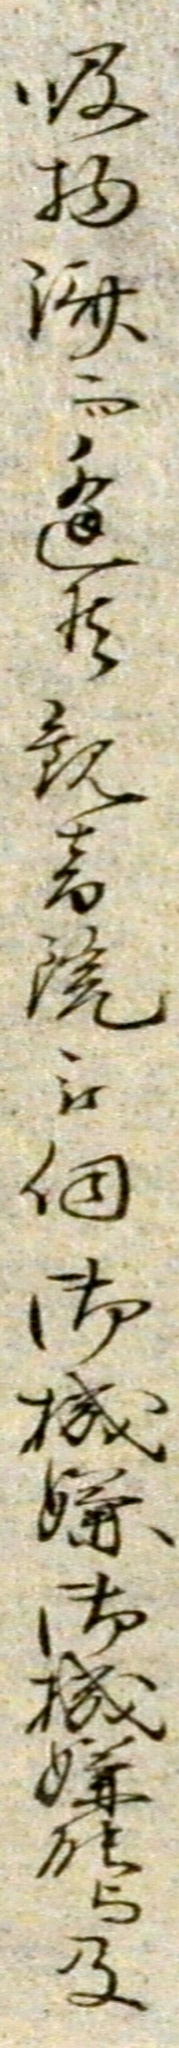吸物済而逢候観音院江伺御機嫌御機嫌能と及
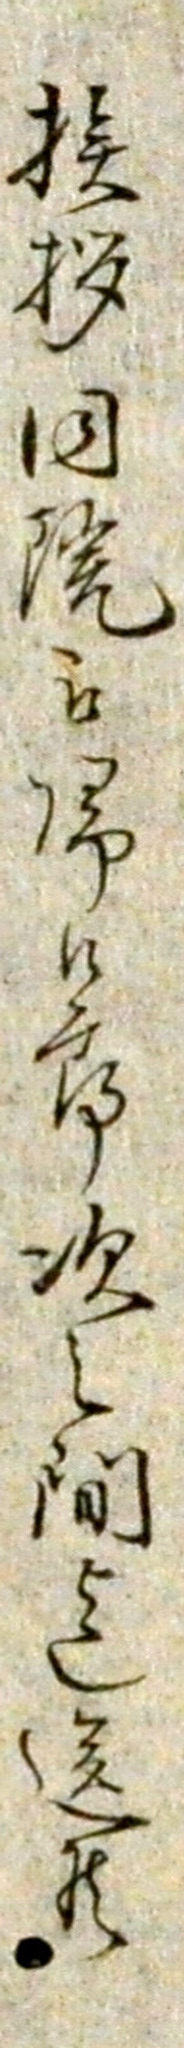挨拶同院江帰候節次之間迠送候
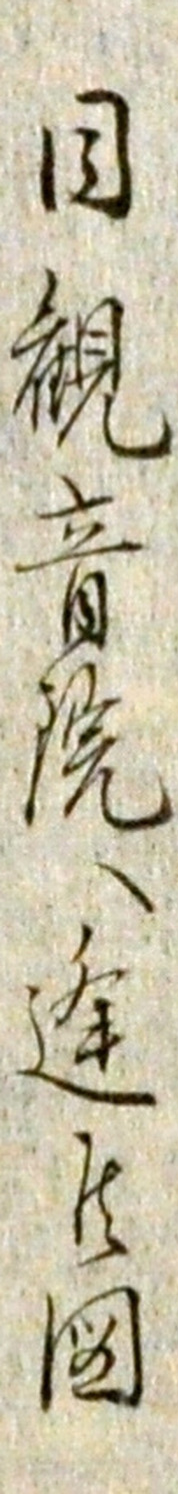同観音院へ逢候図

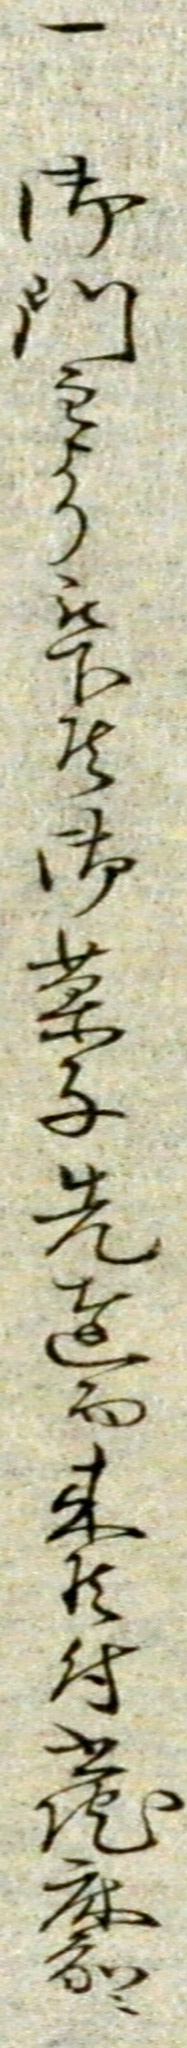一御門主より被下候御菓子先達テ而来候付書院床前ニ
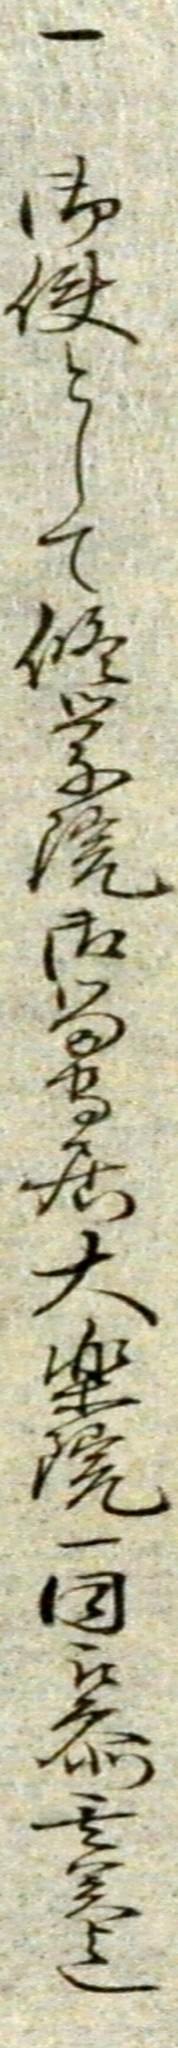一御使として修学院御留守居大楽院一同被参玄関迠
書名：日光御名代相勤候節ノ留
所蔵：伊那市立高遠町図書館・合同会社AMANE
